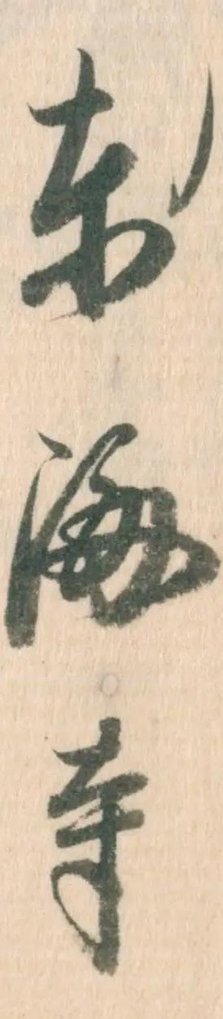東海寺
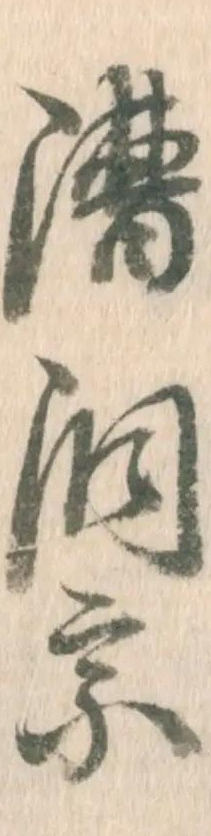曹洞宗

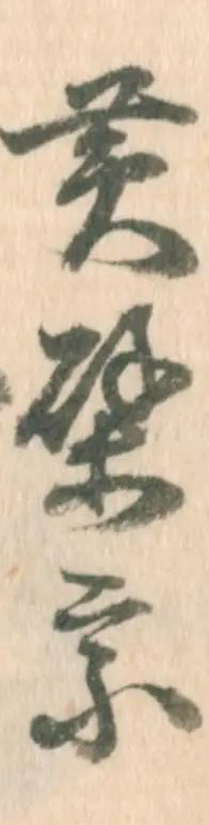黄檗宗
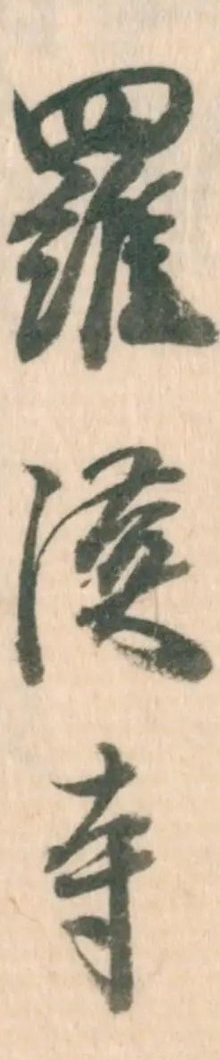羅漢寺
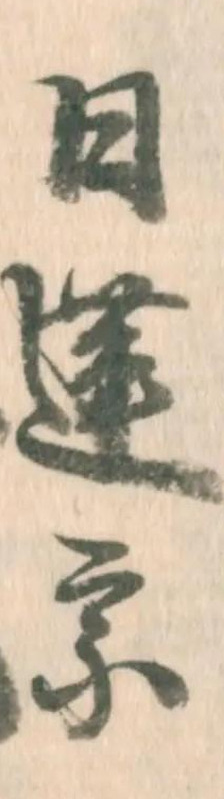日蓮宗
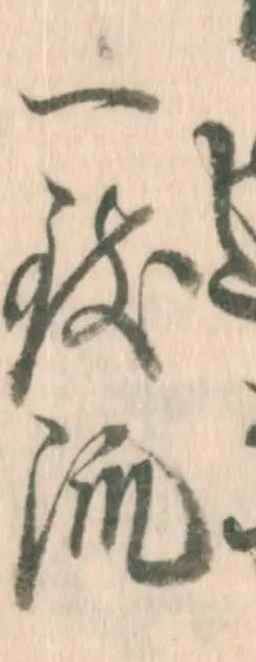一致派
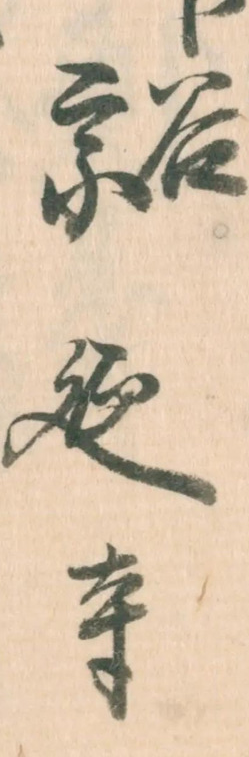宗延寺
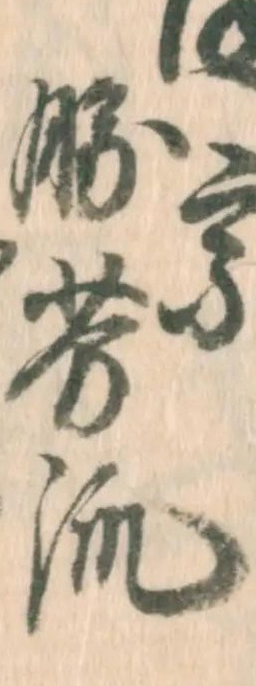勝劣派
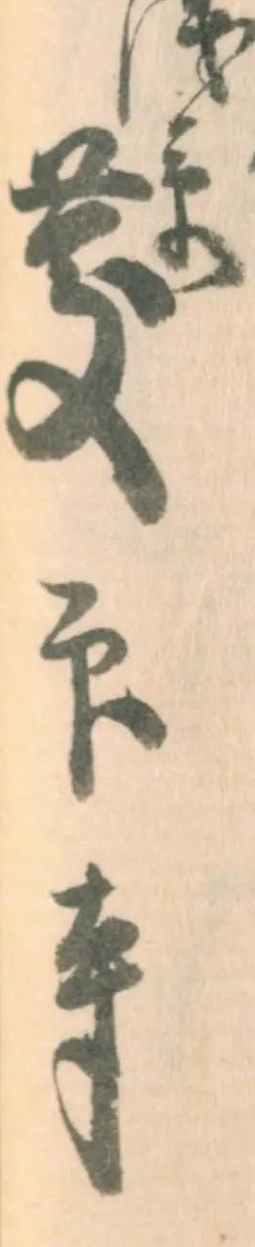慶印寺
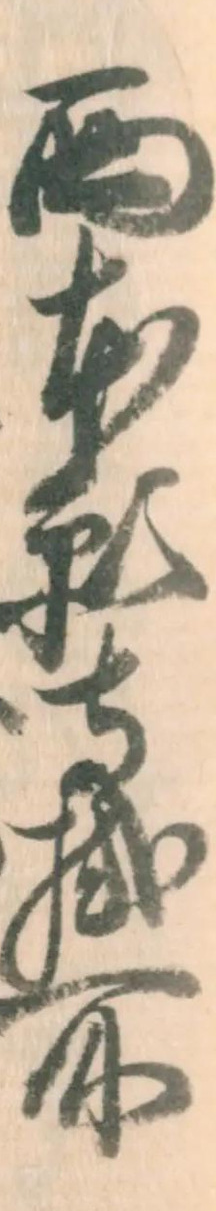西本願寺掛所
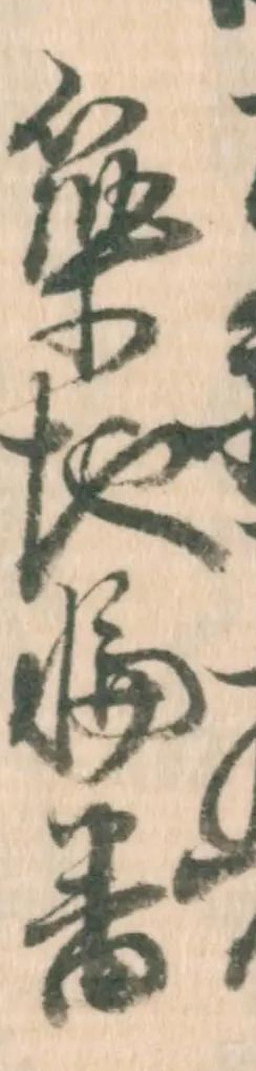築地輪番
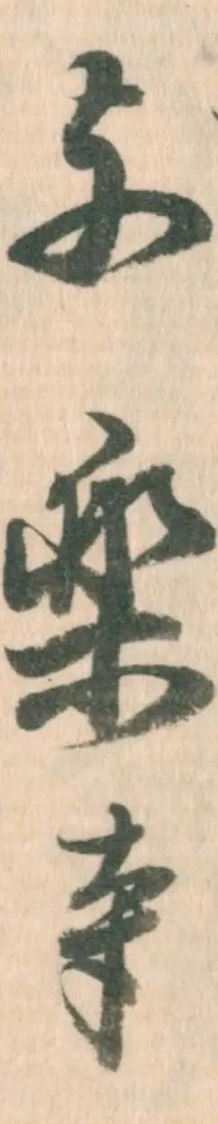与楽寺
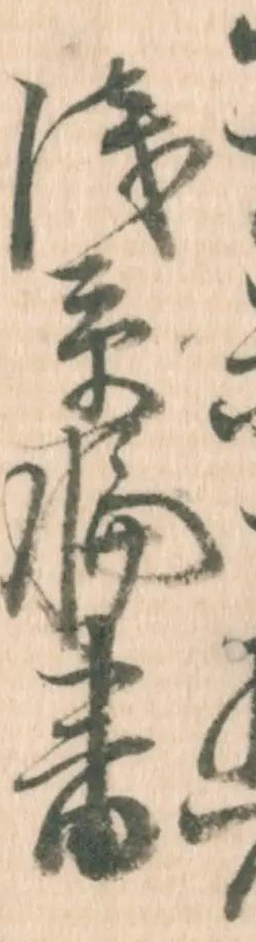浅草輪番
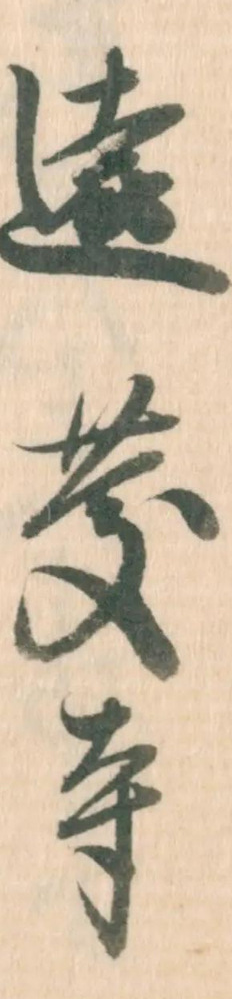遠慶寺
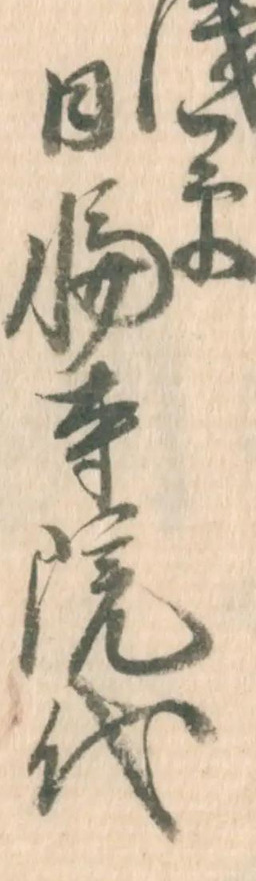日輪寺院代

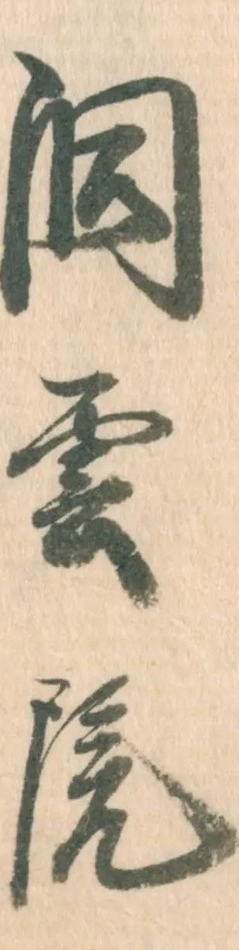洞雲院
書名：地震災書留 2巻. [2] 内表紙に「地震一件　安政二卯年十月」とあり
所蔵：国立国会図書館 National Diet Library, JAPAN
